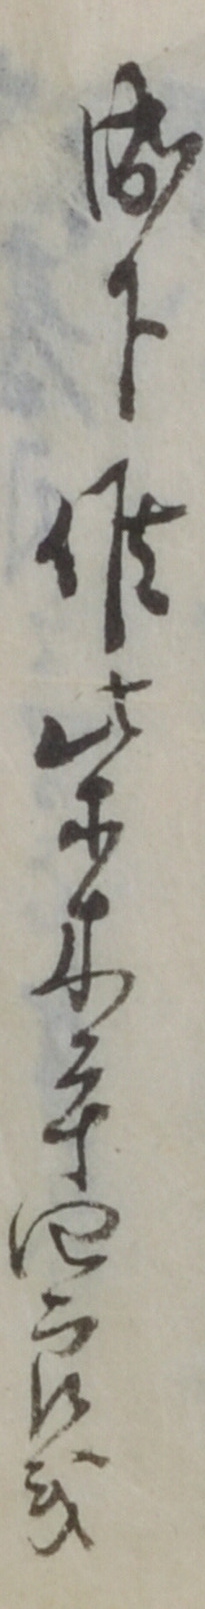成下候柴木平四郎義
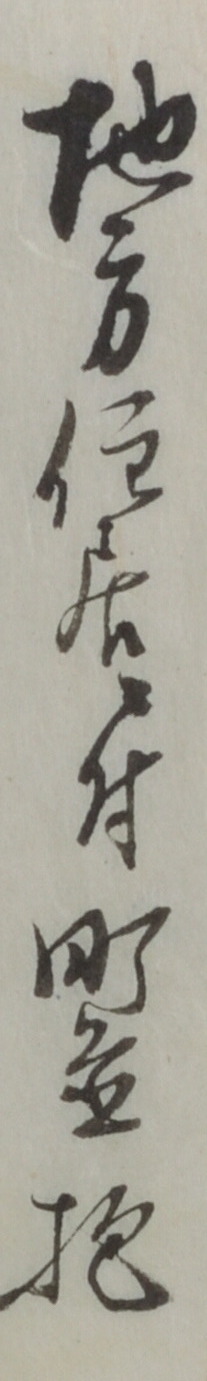地方住居ニ付町並抱
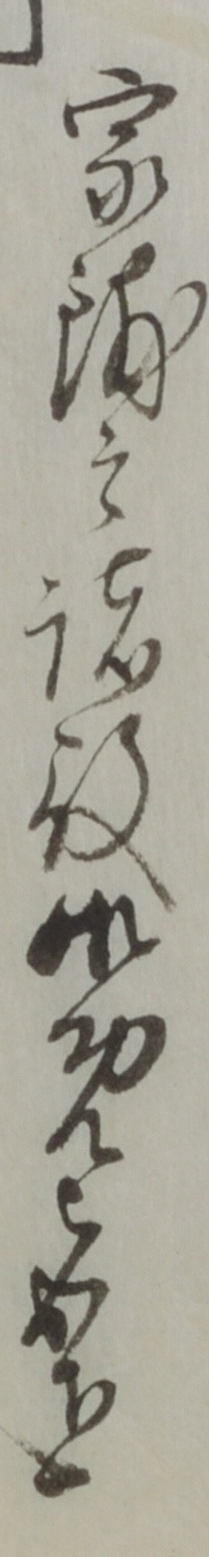家敷之諸役御免被成下候
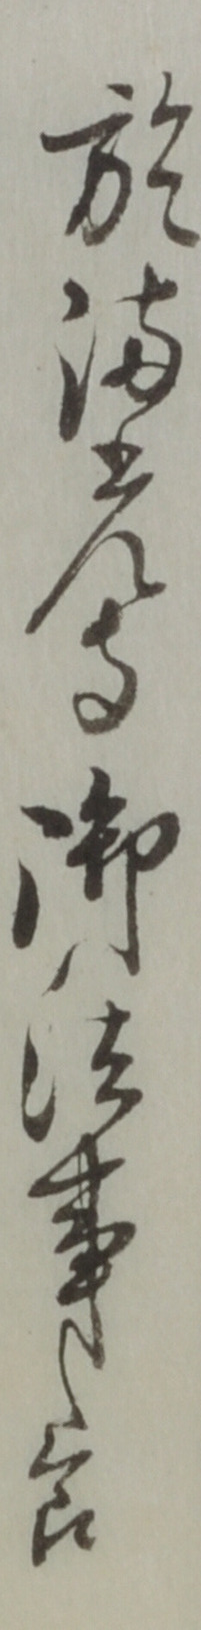於海光寺御法事之節
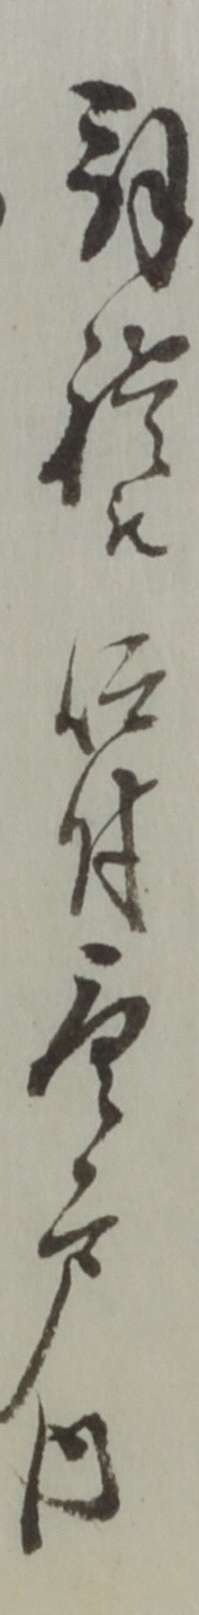拝礼被仰付唐戸内
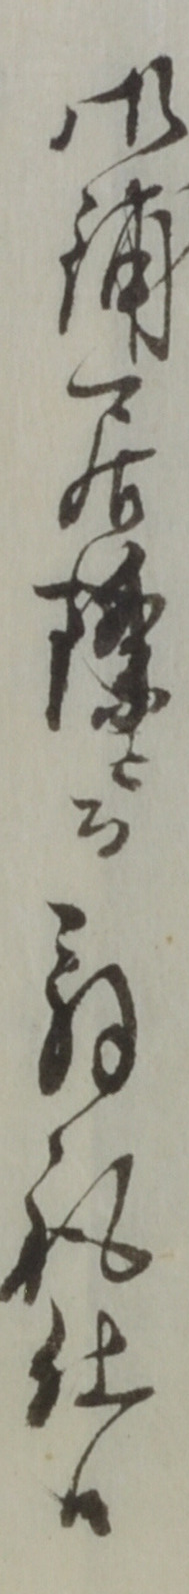御敷居際ニ而拝礼仕候
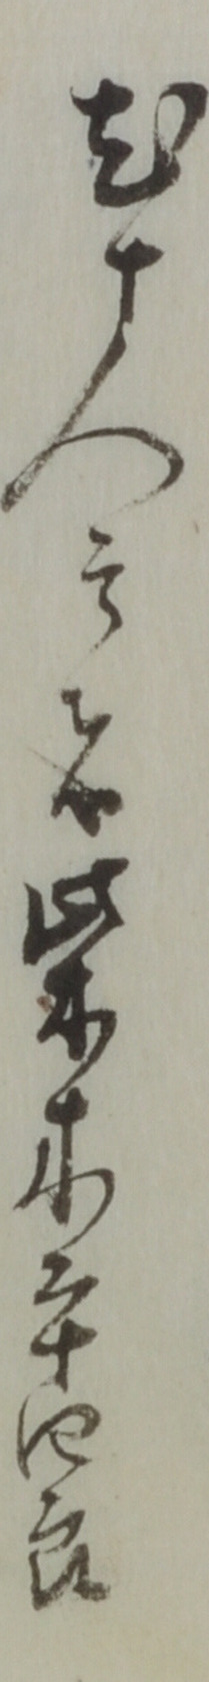尤十人之者柴木平四郎
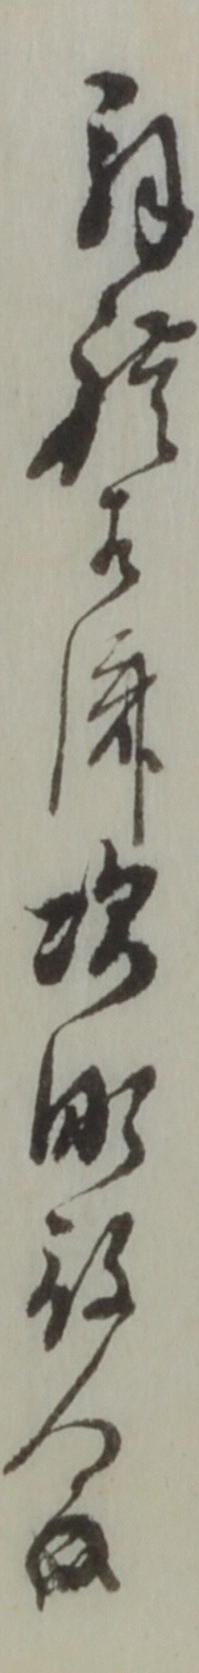拝礼相済次町役人
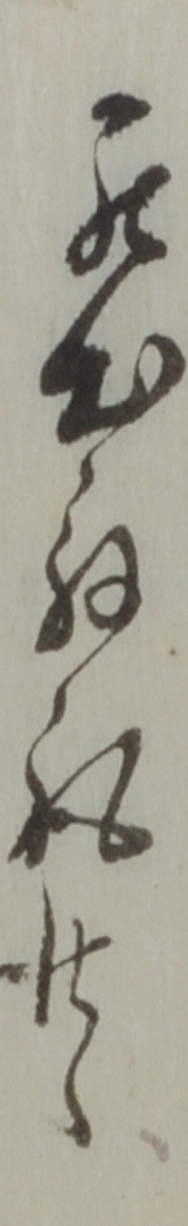罷出拝礼仕候
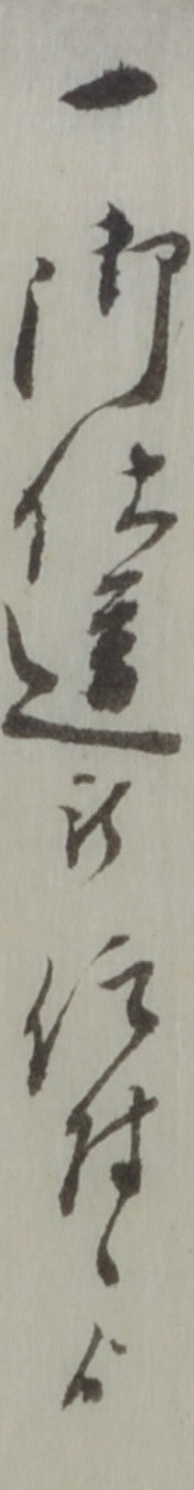一御仕送被仰付候ゟ
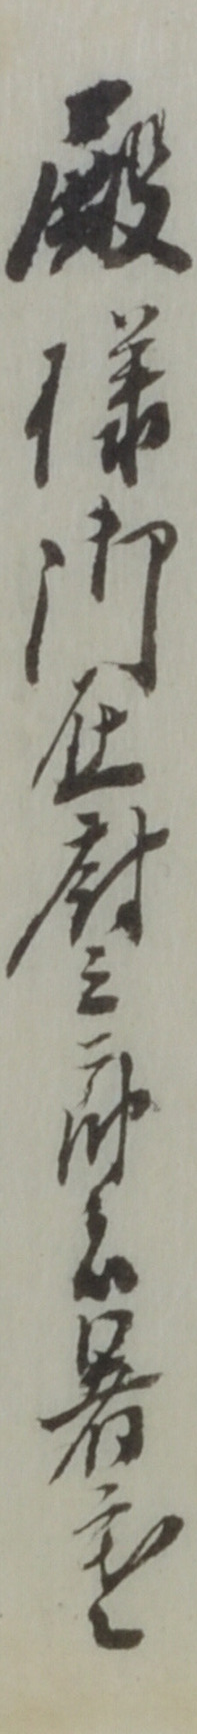殿様御在府之節は暑寒
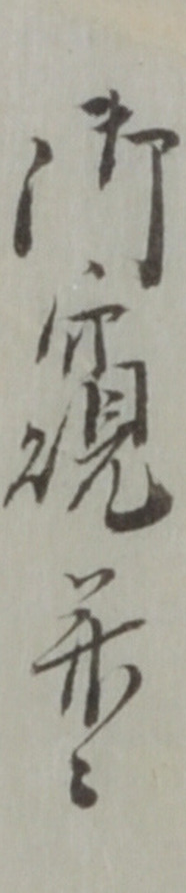御窺并ニ
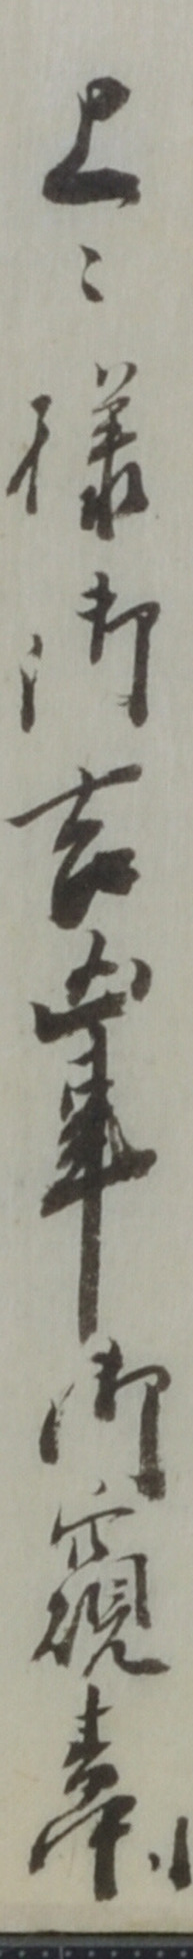上々様御吉凶事御窺書中
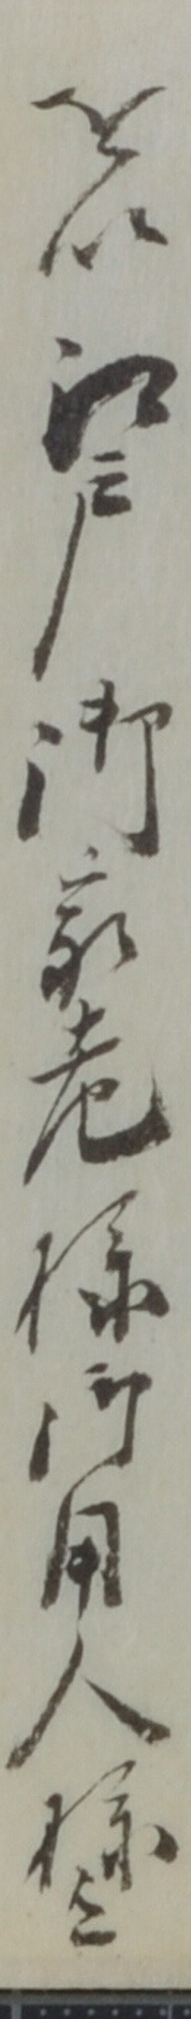を以江戸御家老様御用人様迄
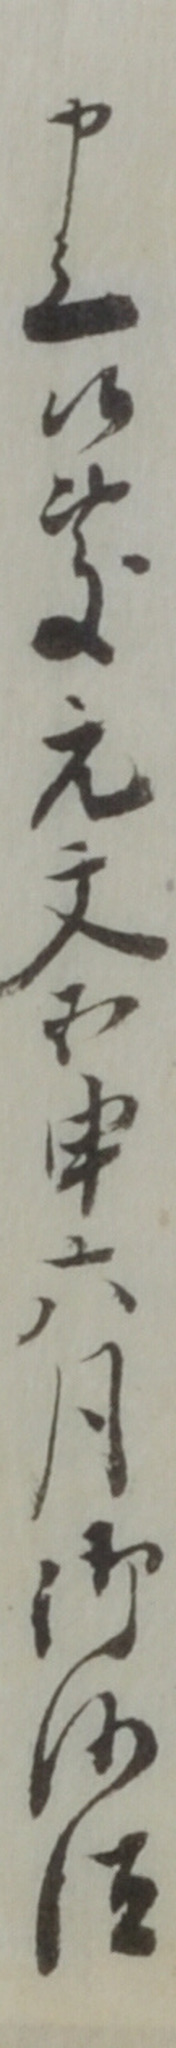申上候処元文五申六月御沙汰
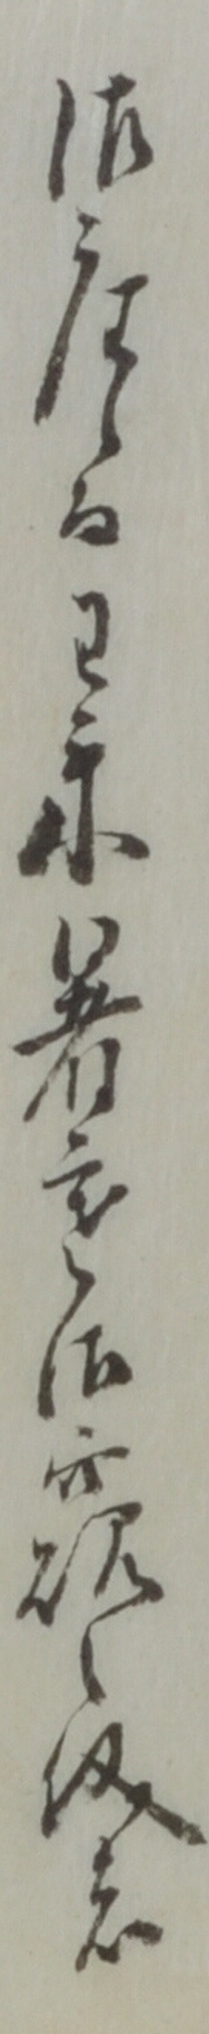御座候而已来暑寒御窺之儀は
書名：抜書
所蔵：伊那市立高遠町図書館・合同会社AMANE
